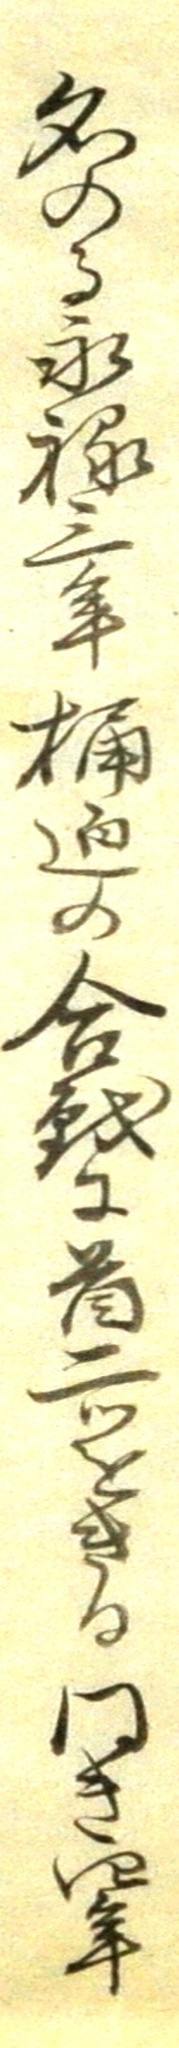名のる永禄三年桶迫の合戦に首二ツをきる同き四年
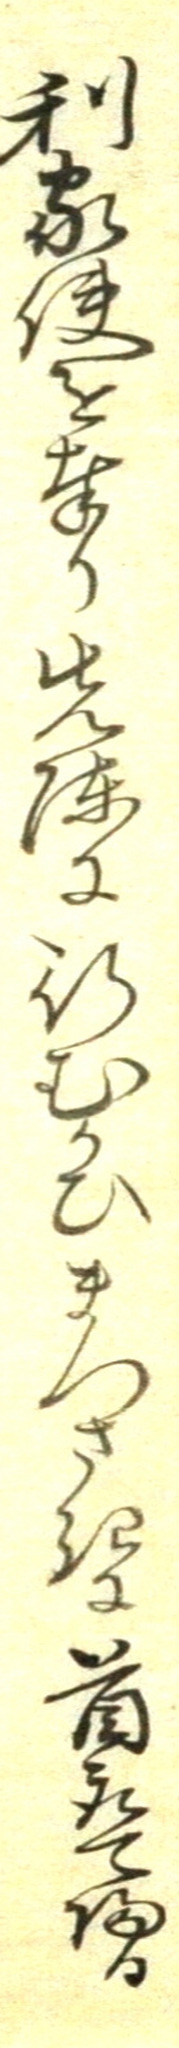利家使を奉り先陣に行むかひまつさきに首取て帰る
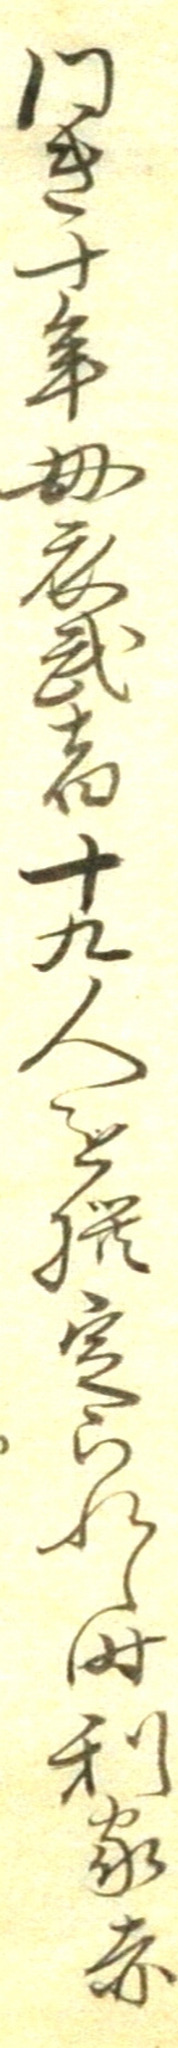同き十年母衣武者十九人を撰定られし時利家赤
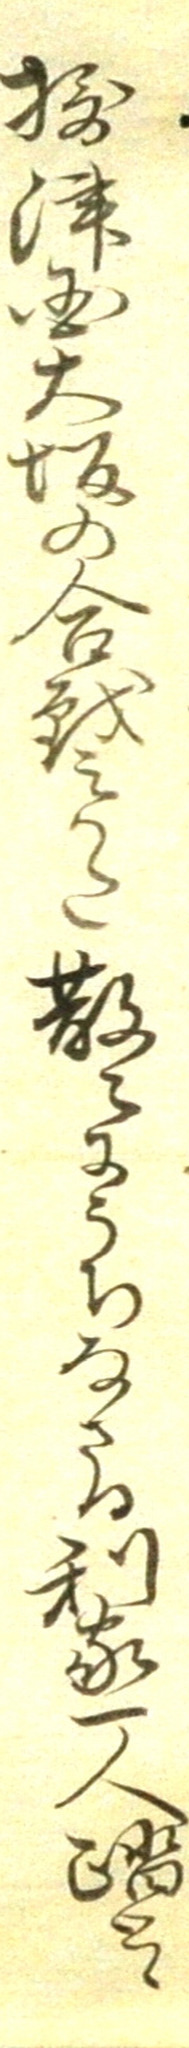摂津国大阪の合戦みかた散々にうちなさる利家一人踏とゝ
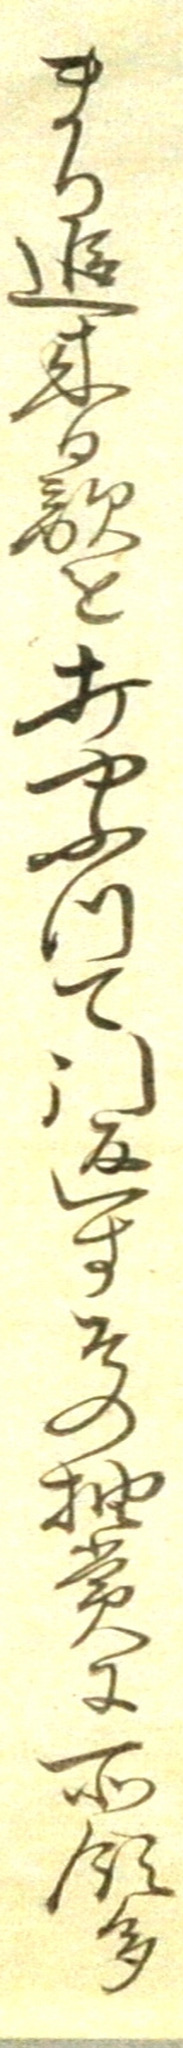まり追来る敵を打やふつて引返すその抽賞に所領多
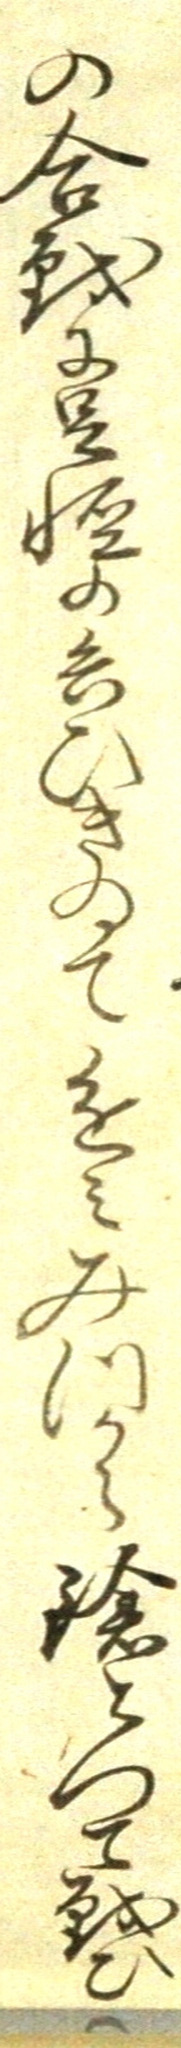の合戦に足軽の兵ひきゐて進みみつから鎗をとつて戦ひ
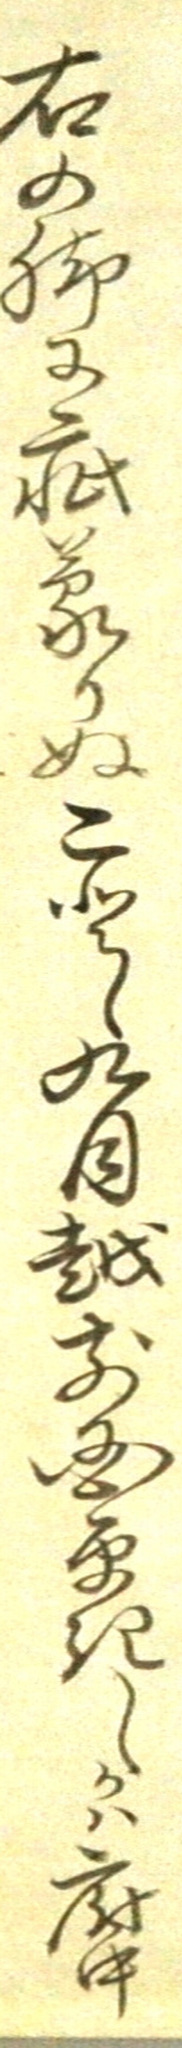右の脚に疵蒙りぬことし九月越前国平きしかは府中
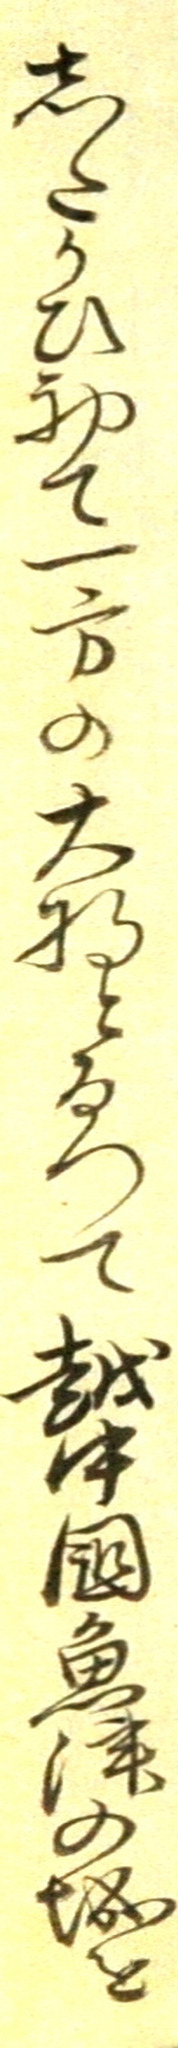したかひ初て一方の大将となつて越中国魚津の城を

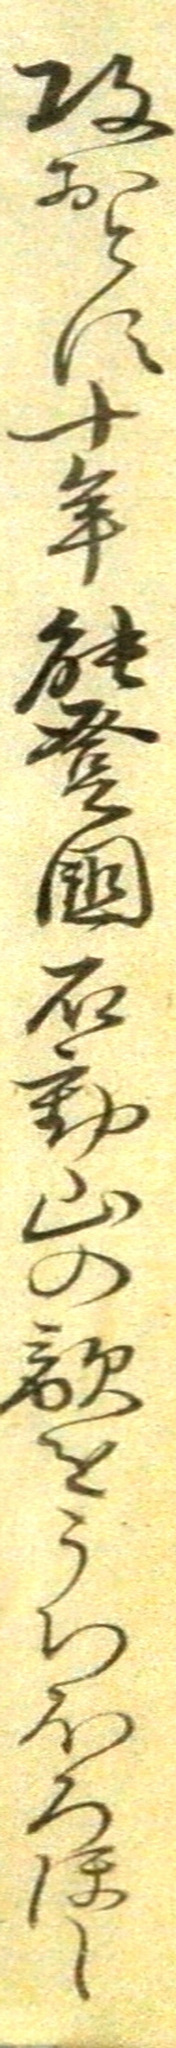攻おとす十年能登国石動山の敵をうちほろほし
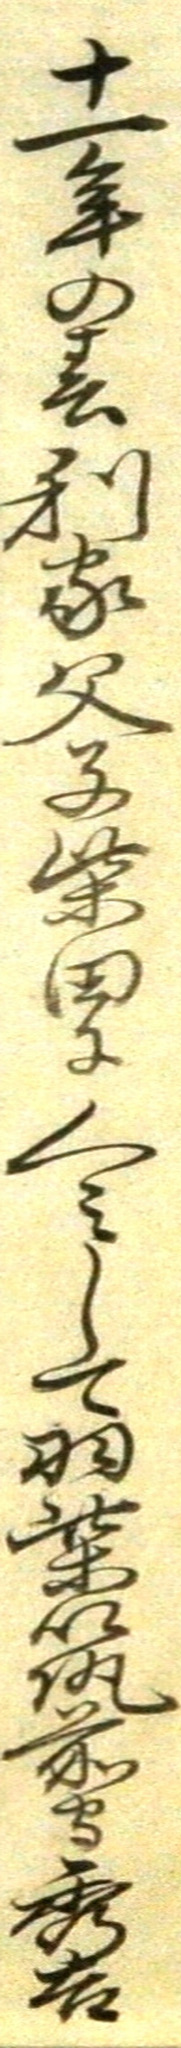十一年の春利家父子柴田にくみして羽柴筑前守秀吉
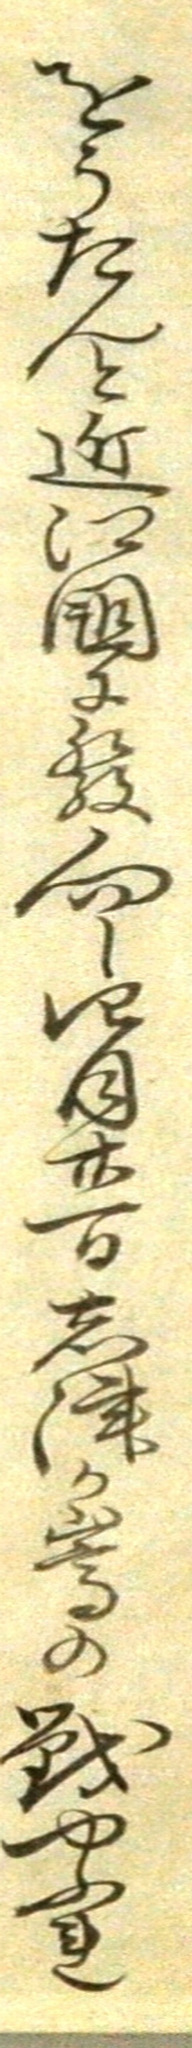をうたんと近江国に発向し四月廿一日志津か嵩の戦やふれ
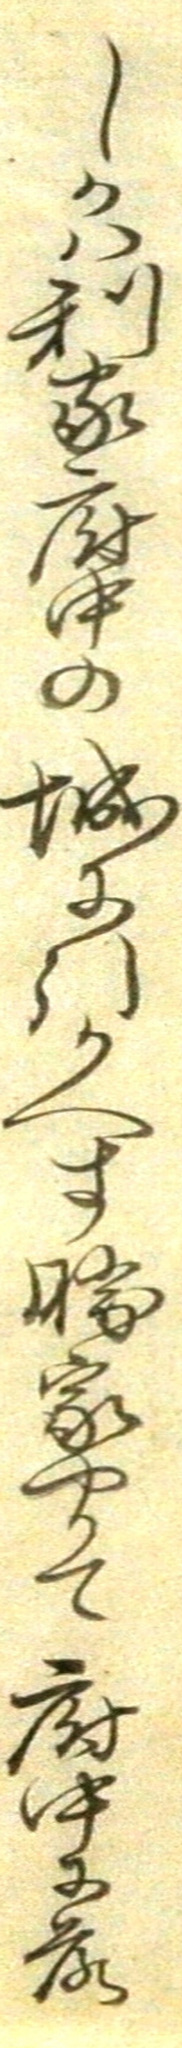しかは利家府中の城に引かへす勝家やかて府中に落
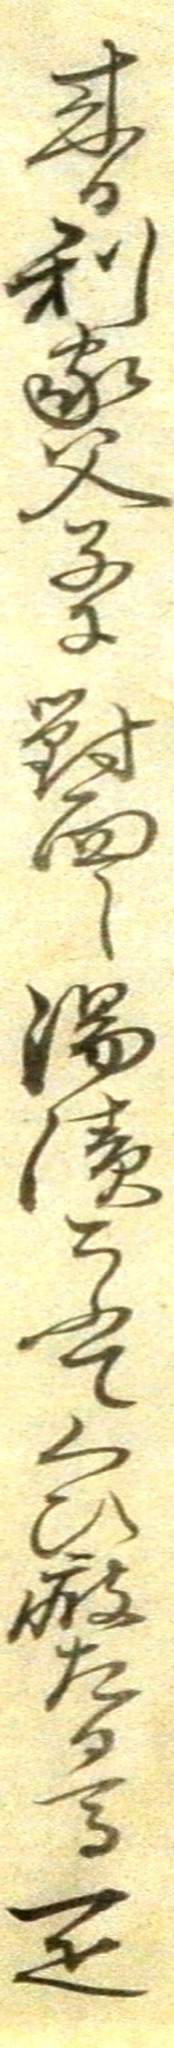来る利家父子に対面し湯漬とふてくひ疲たる馬一疋
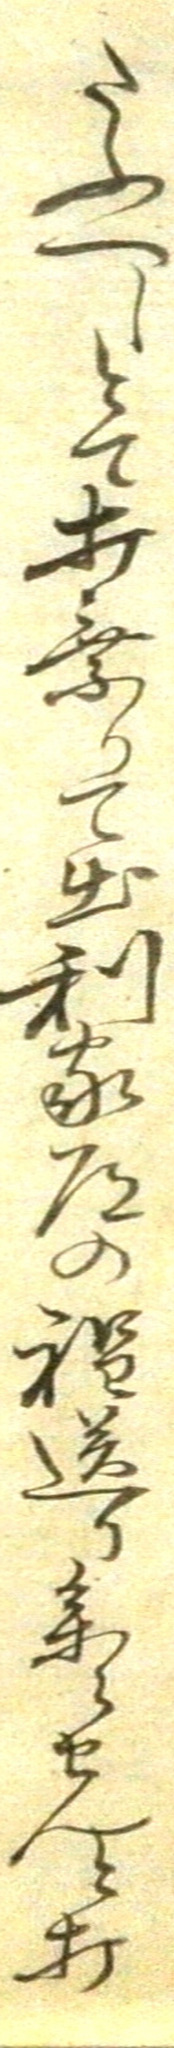たふへしとて打乗りて出利家道の程送り参らせんと打
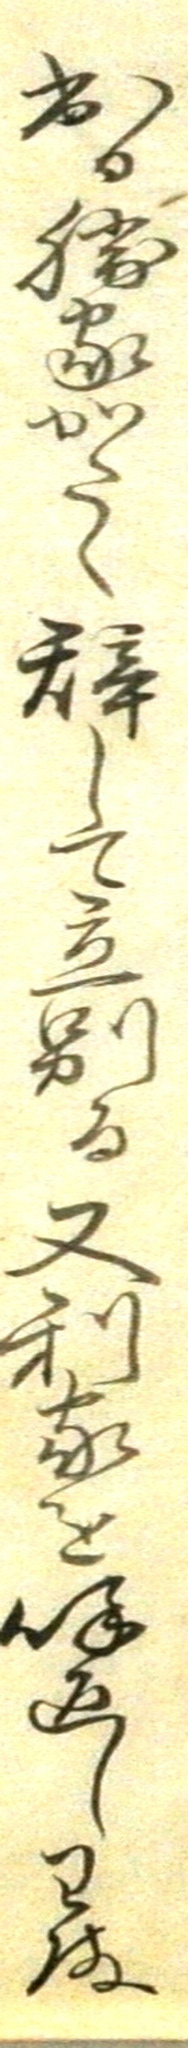出る勝家かたく辞して立別る又利家を呼返しわ殿
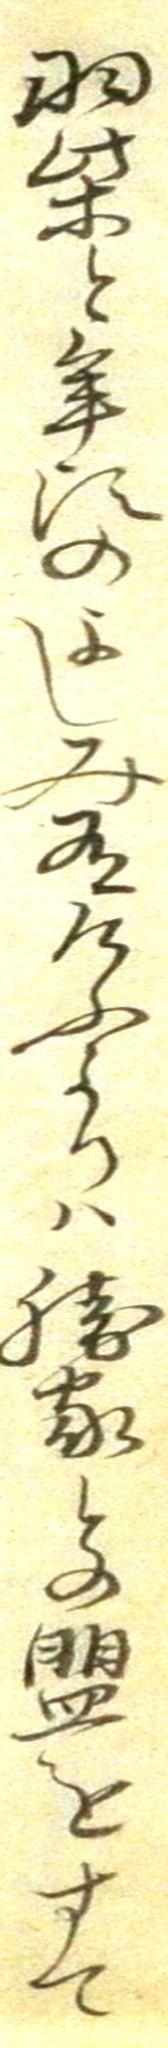羽柴と年頃のよしみ有けふよりは勝家との盟をすて
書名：藩翰譜（七・上）
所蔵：伊那市立高遠町図書館・合同会社AMANE
